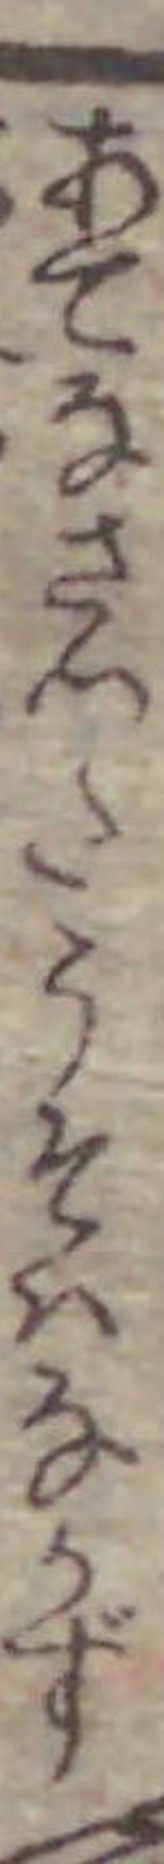あてなさつたうそはなかず
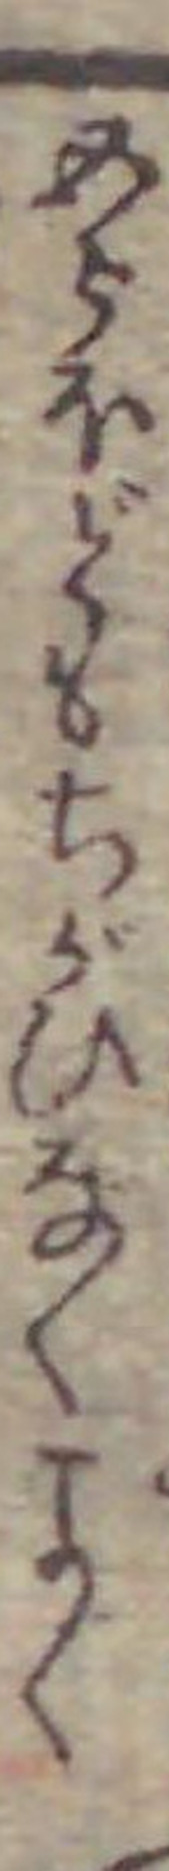五分ほどもちがひなくよく
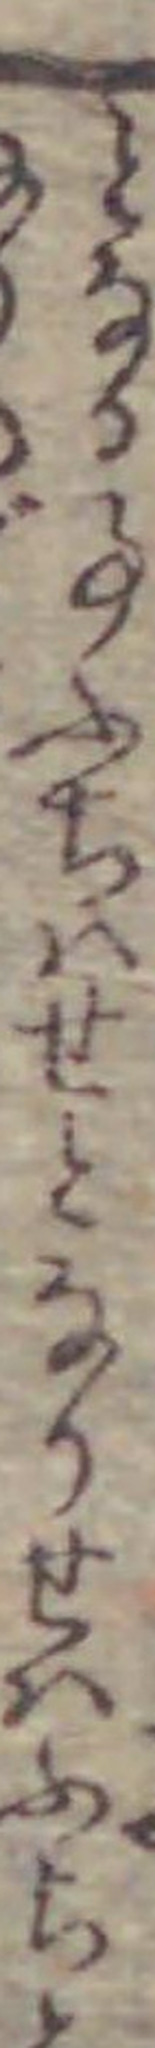となる事ふちはせとなりせはふちと
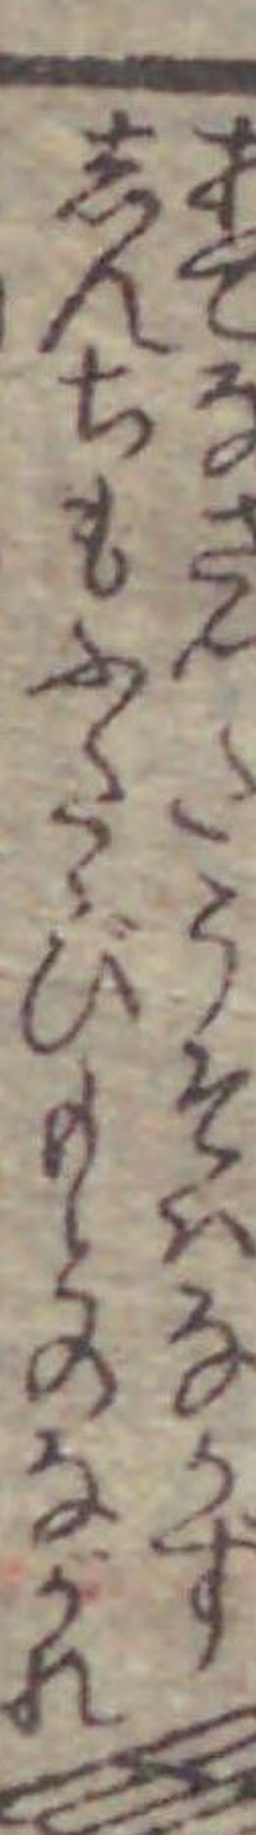しんちもふたゝびもとのながれ
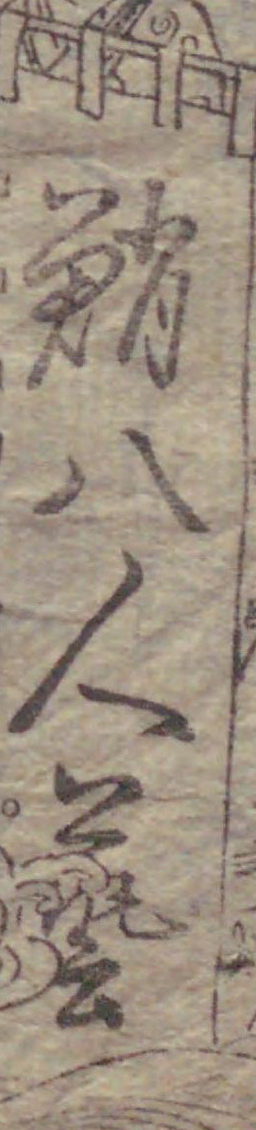鮹八人芸
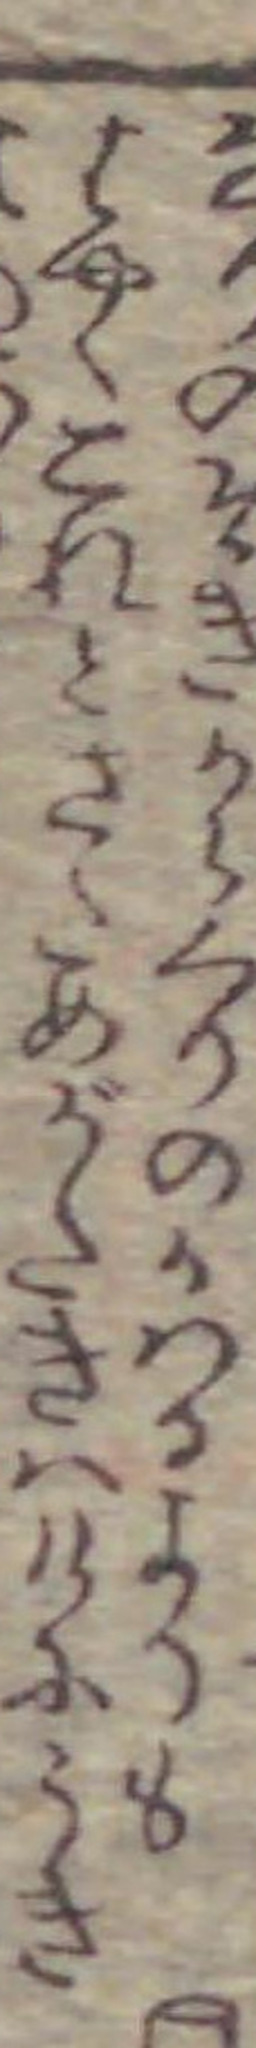はやくこれとさためがたきはけふうき
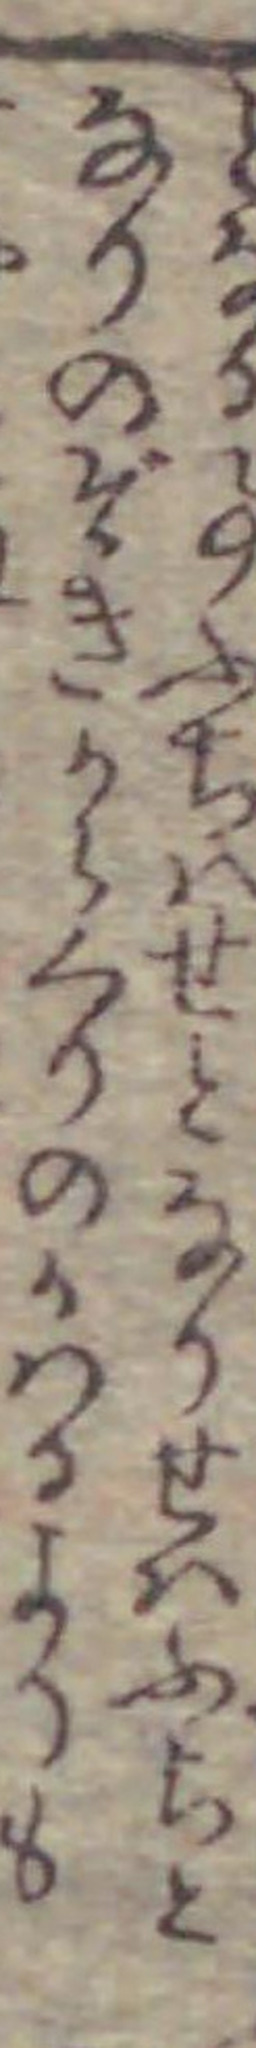なりのぞきからくりのかはるよりも
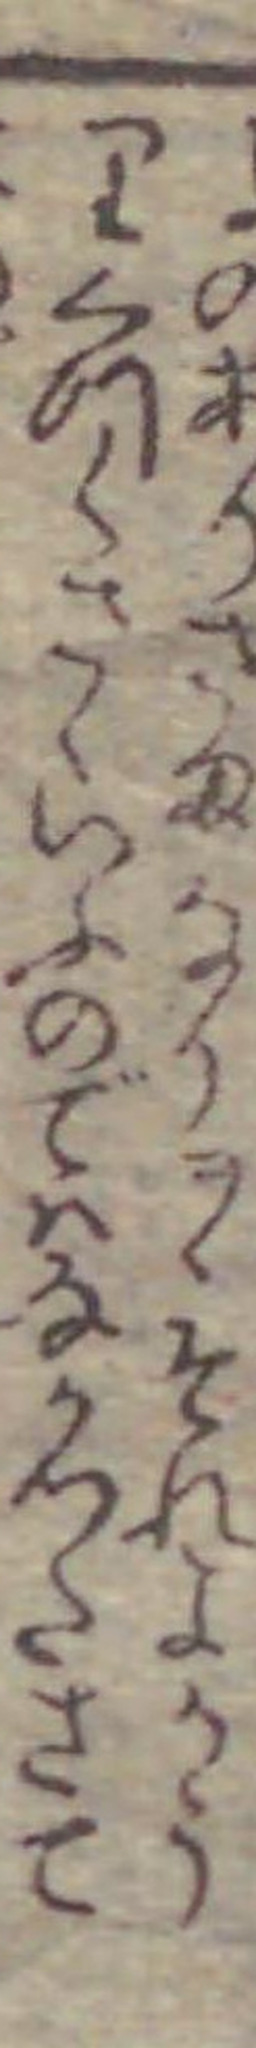りくつくさくいふのではなかつたさて
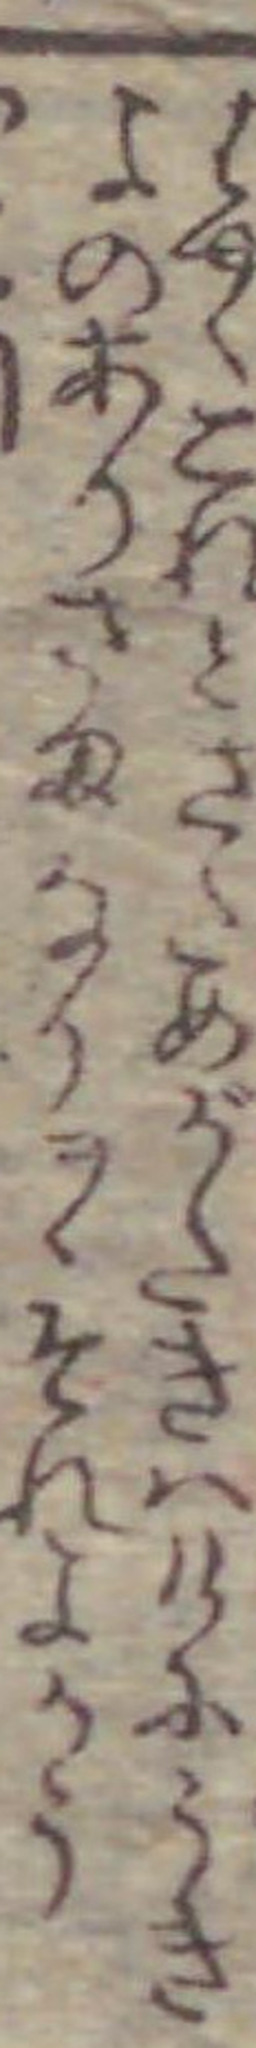よのありさまなりヲヽそれよかう
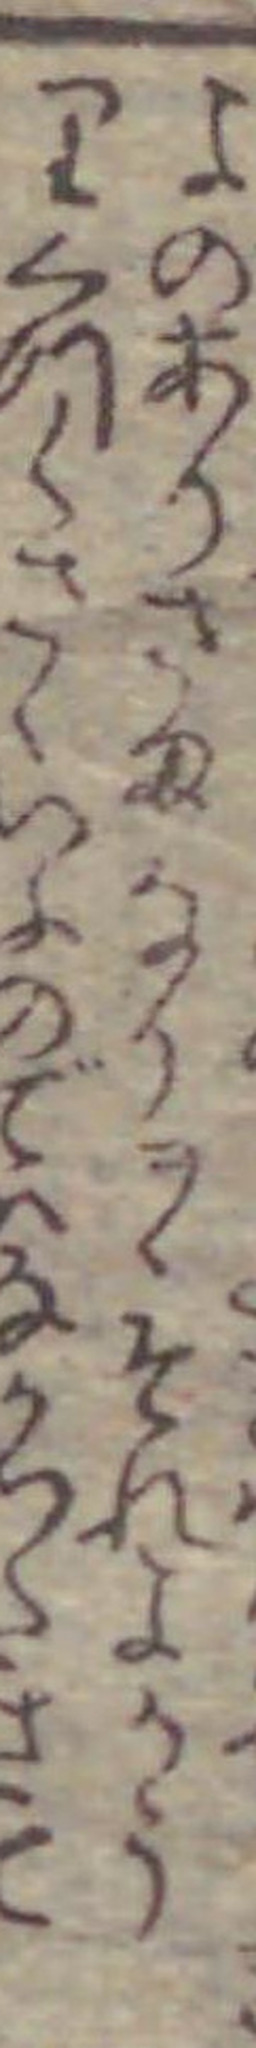りくつくさくいふのではなかつたさて
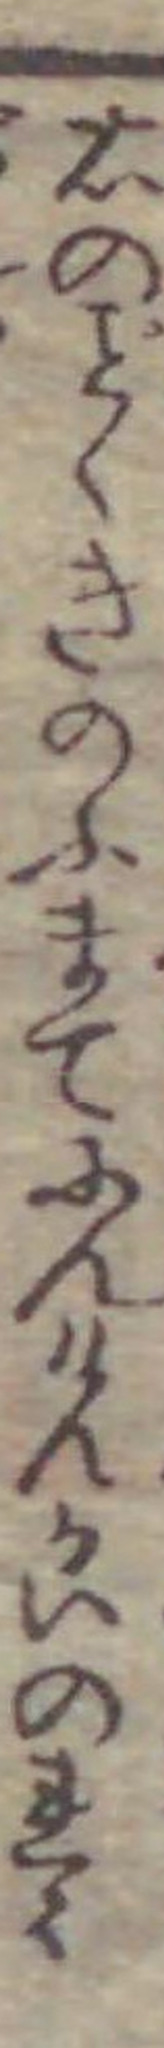右のごとくきのふまてにんけんかいのれう
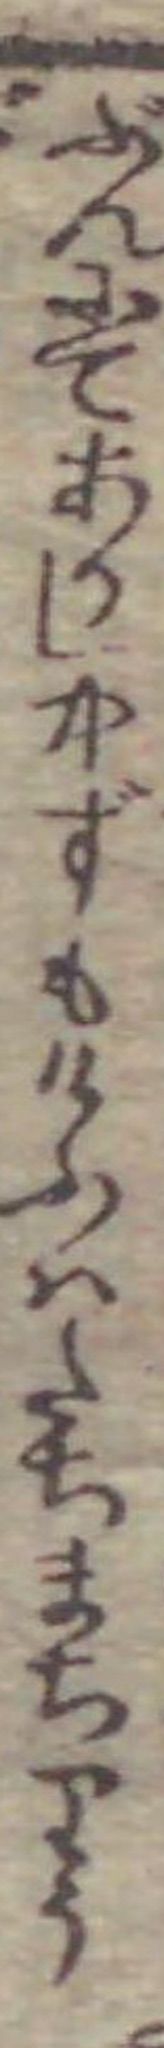ぶんにてありし中ずもけふはたちまちりう
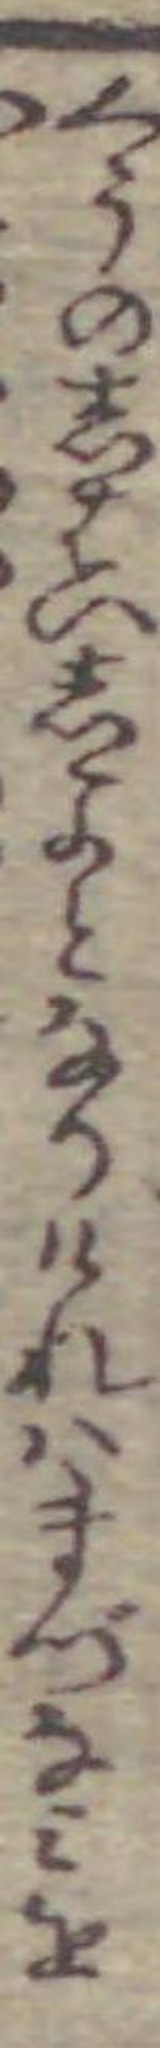ぐうのしはいしよとなりけれはまづなみを
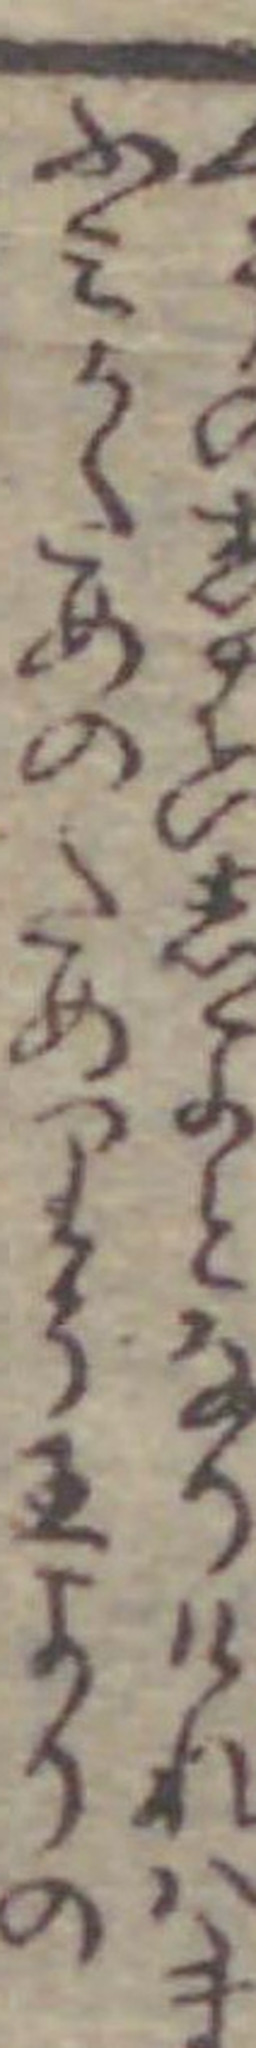ふみかためのためりう応よりの
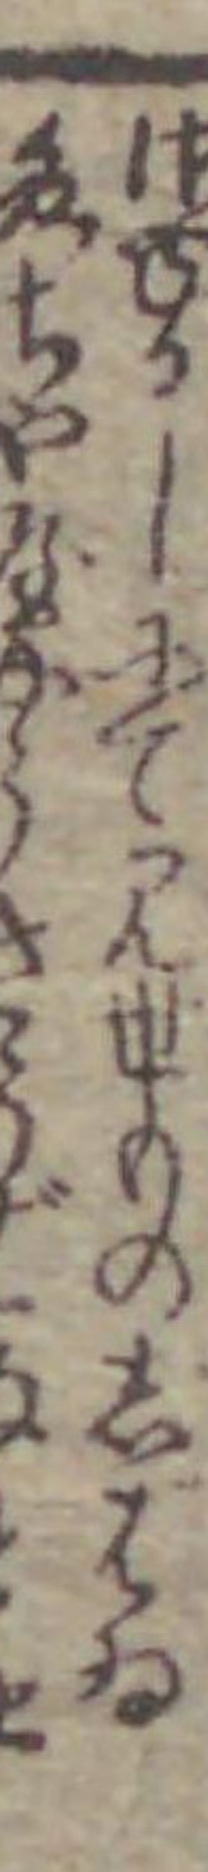水ちや屋やうきうばなとを
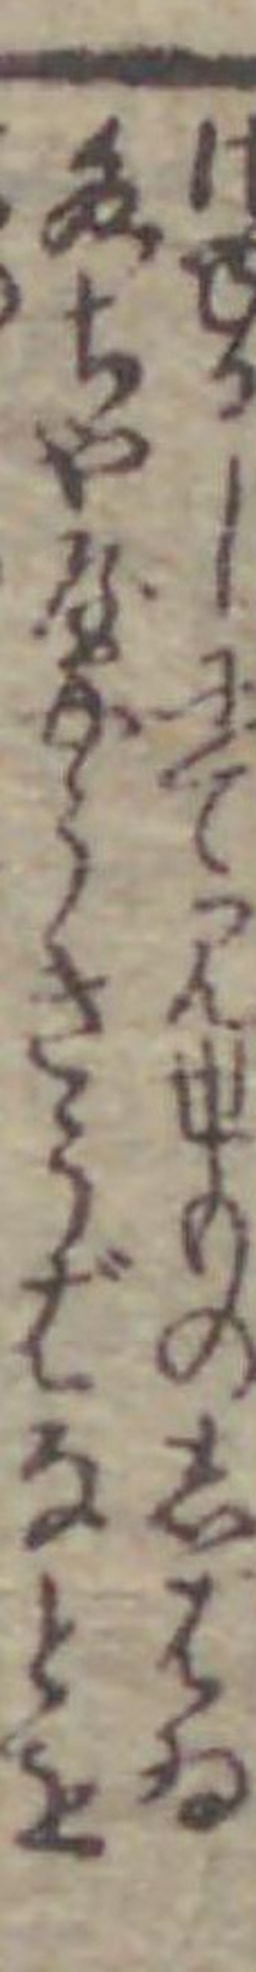水ちや屋やうきうばなとを
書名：箱入娘面屋人魚 3巻
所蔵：国立国会図書館 National Diet Library, JAPAN
